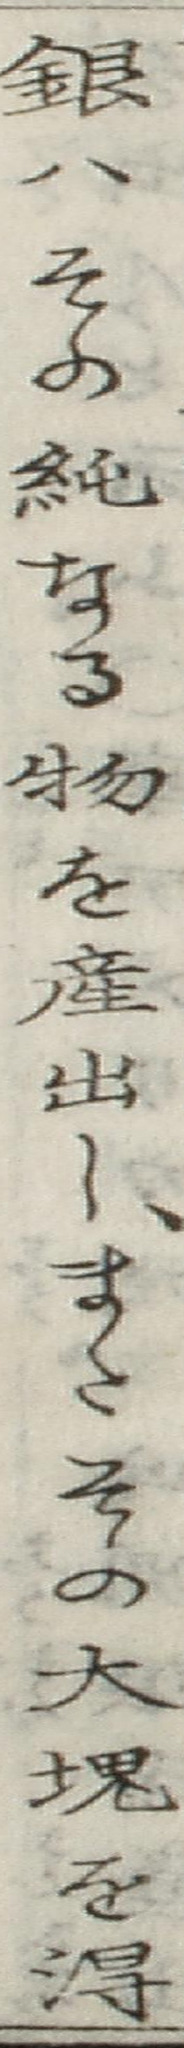銀はその純なる物を産出し、またその大塊を得
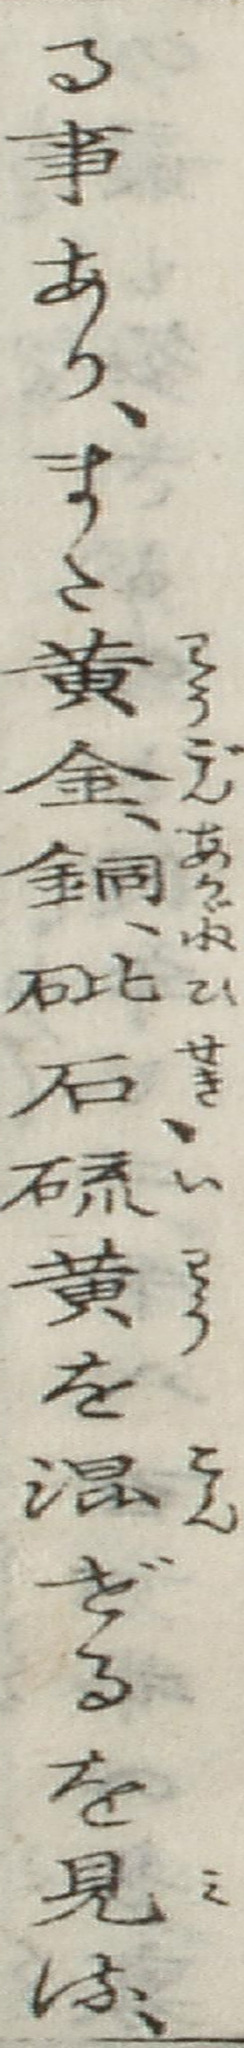る事あり、また黄金、銅、砒石、硫黄を混ぜるを見る、
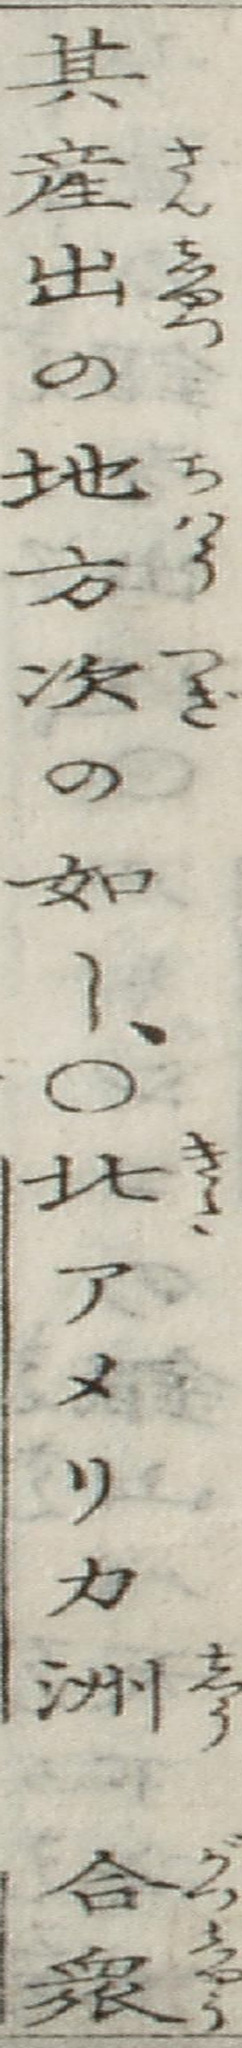其産出の地方次の如し、○北アメリカ洲合衆
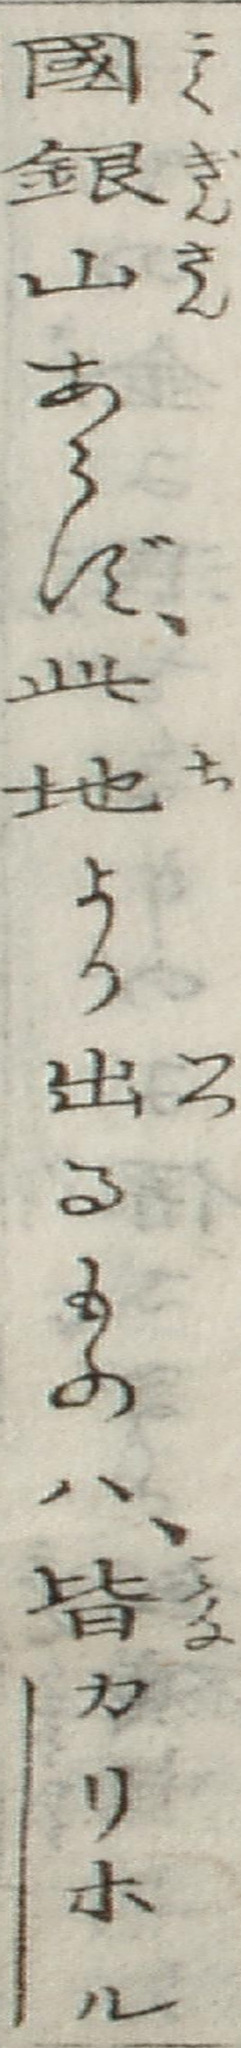国銀山あらず、此地より出るものは、皆カリホル

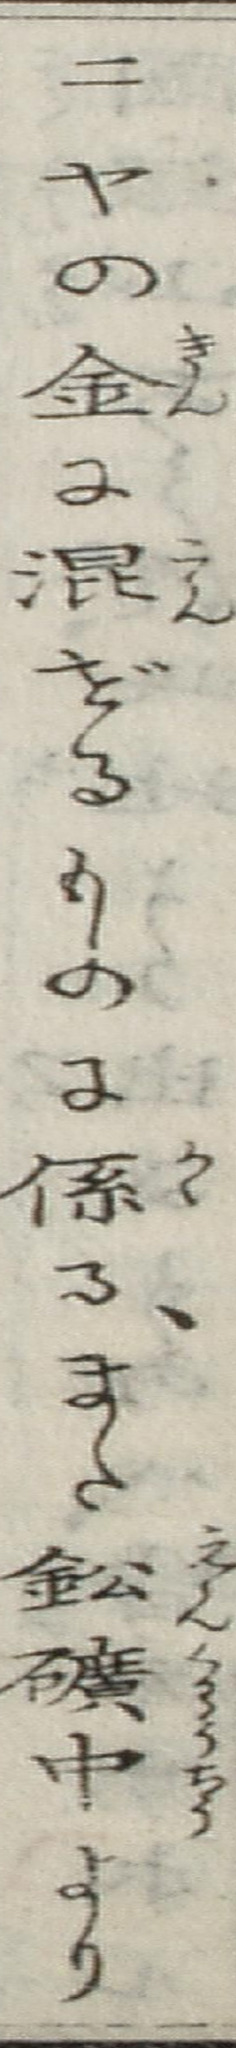ニヤの金に混ぜるものに係る、また鉛鉱中より
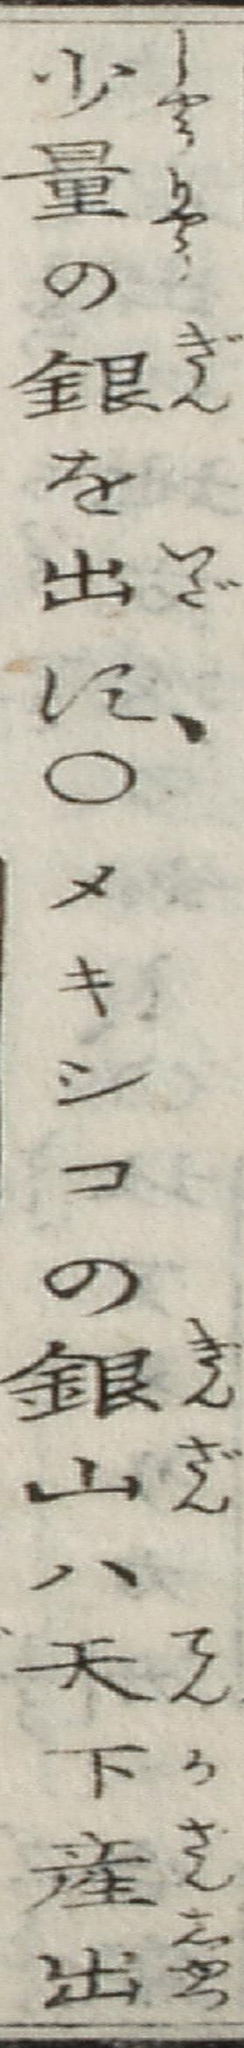少量の銀を出す、○メキシコの銀山は天下産出
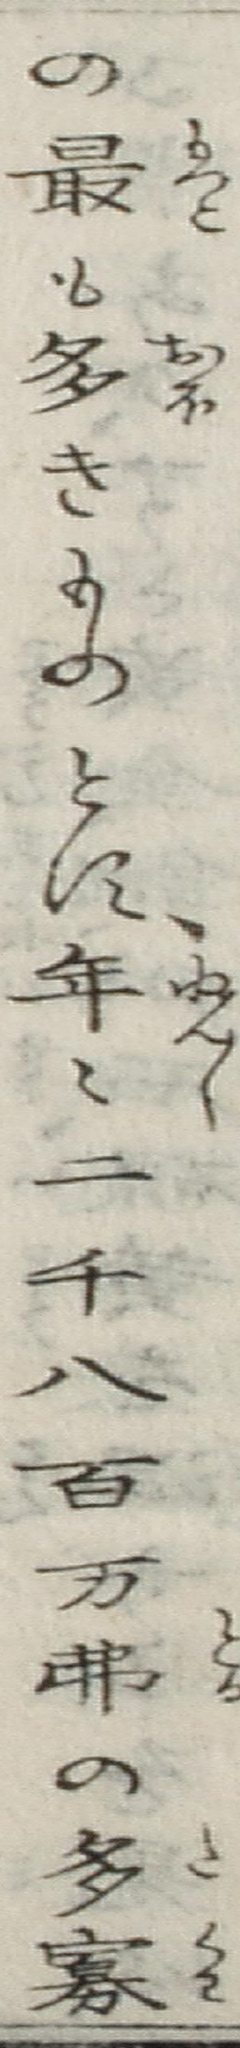の最も多きものとす、年〻二千八百万弗の多寡
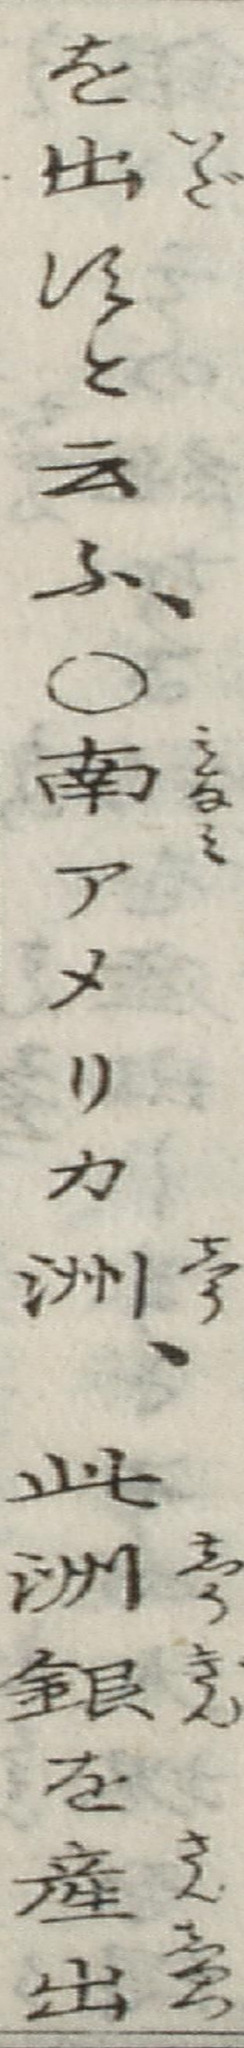を出すと云ふ、○南アメリカ洲、此洲銀を産出
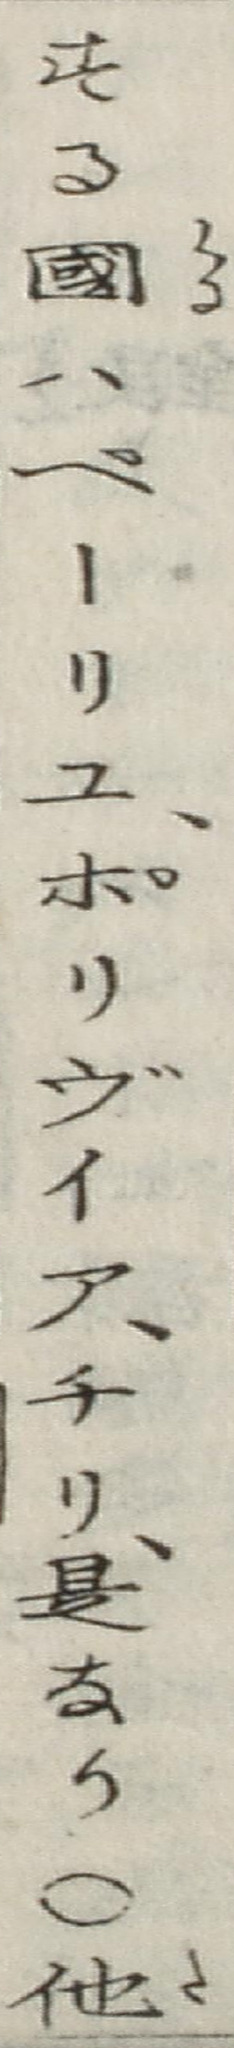する国はベーリユ、ポリヴィア、チリ、是なり○他
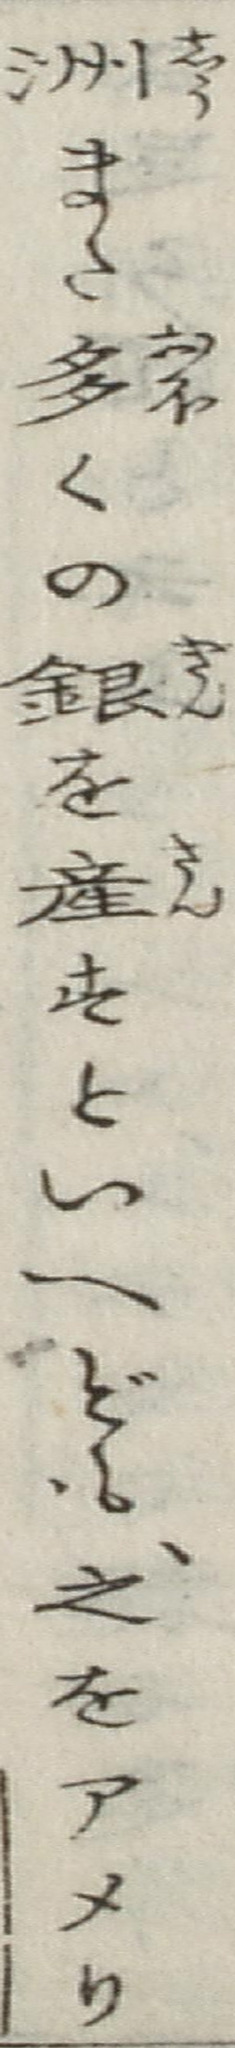洲また多くの銀を産すといへども、之をアメリ
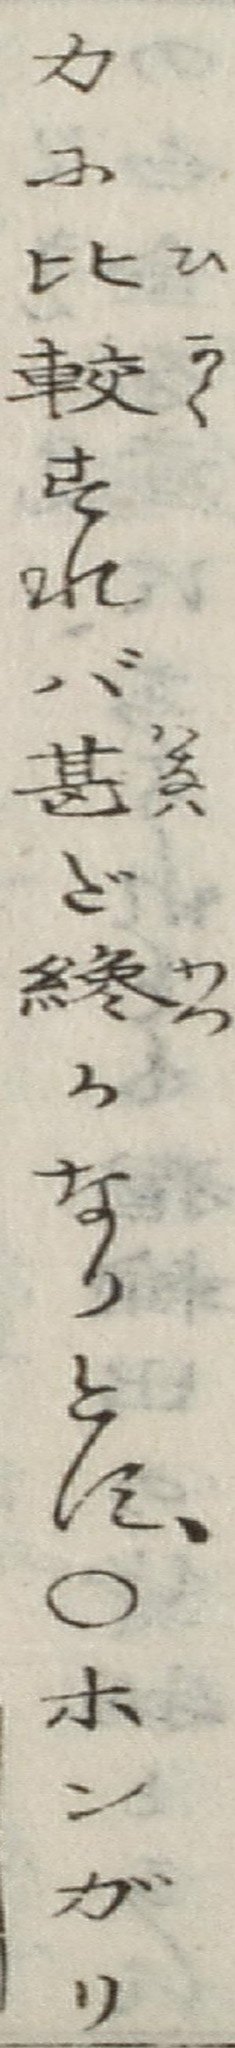カに比較すれば甚だ纔かなりとす、○ホンガリ
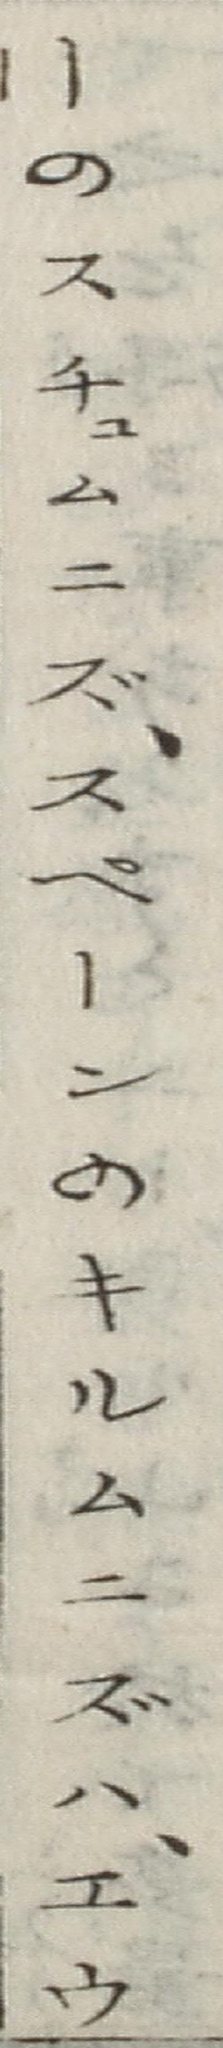ーのスチュムニズ、スペーンのキルムニズハ、エウ
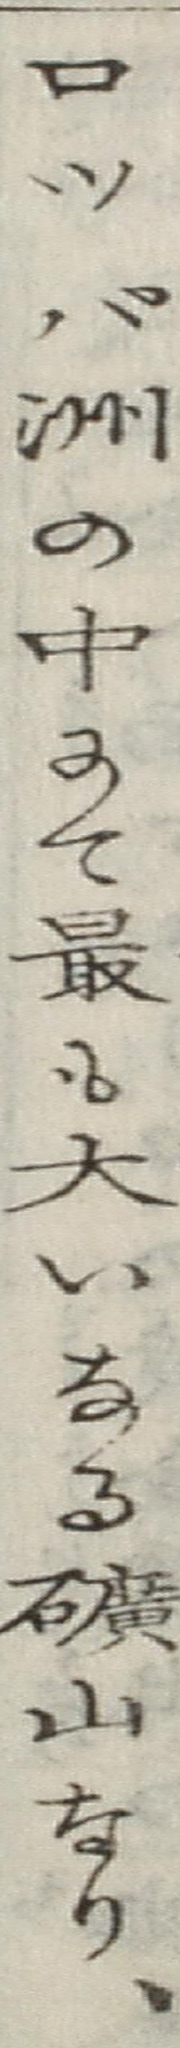ロツパ洲の中にて最も大いなる砿山なり、
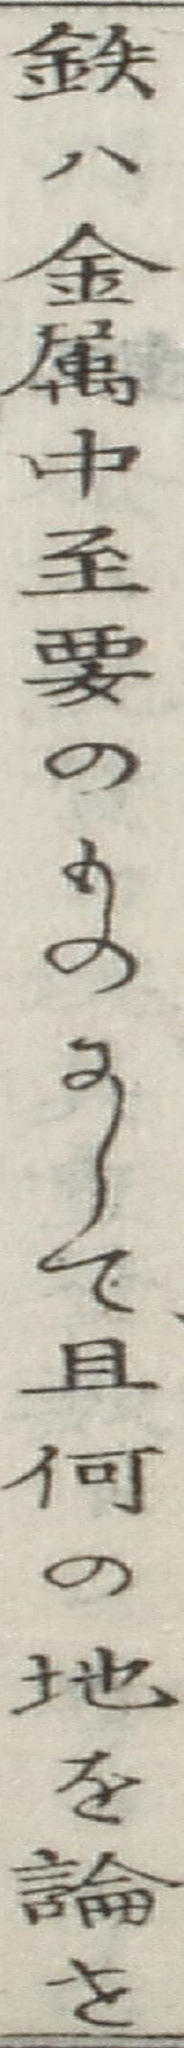鉄は金属中至要のものにして、且何の地を論せ
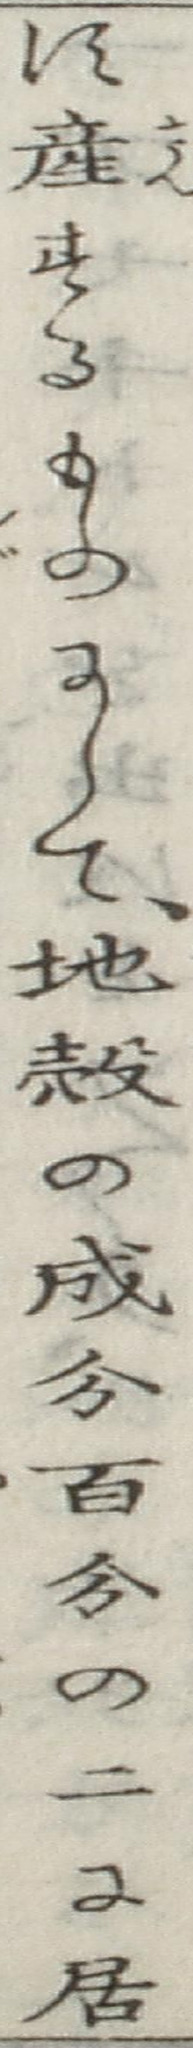す産するものにして、地殻の成分百分の二に居
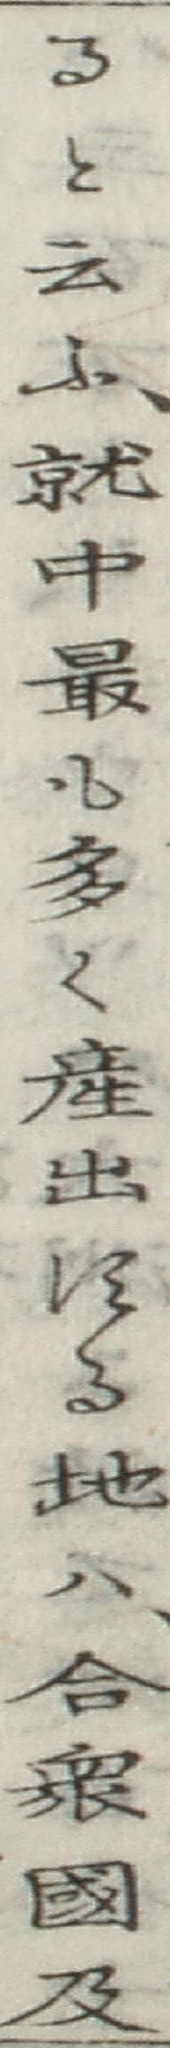ると云ふ、就中最も多く産出する地は、合衆国及
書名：訓蒙　天然地理學　下
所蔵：東京大学地震研究所図書室 Earthquake Research Institute Library, The University of Tokyo, JAPAN
